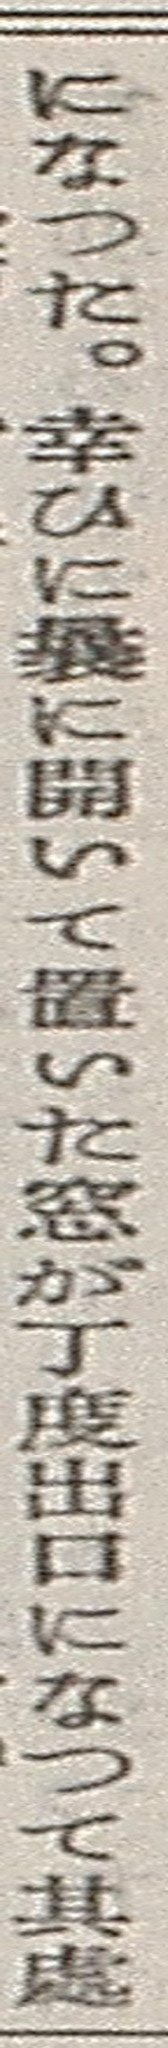になつた。幸ひに曩に開いて置いた窓が丁度出口になつて其処
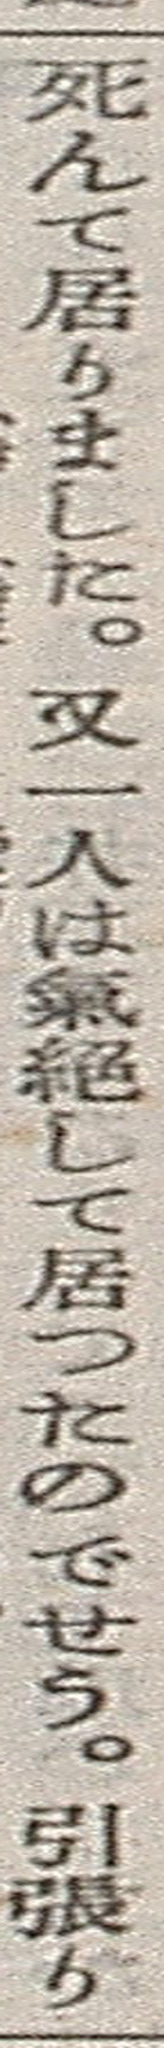死んて居りました。又一人は気絶して居つたのでせう。引張り
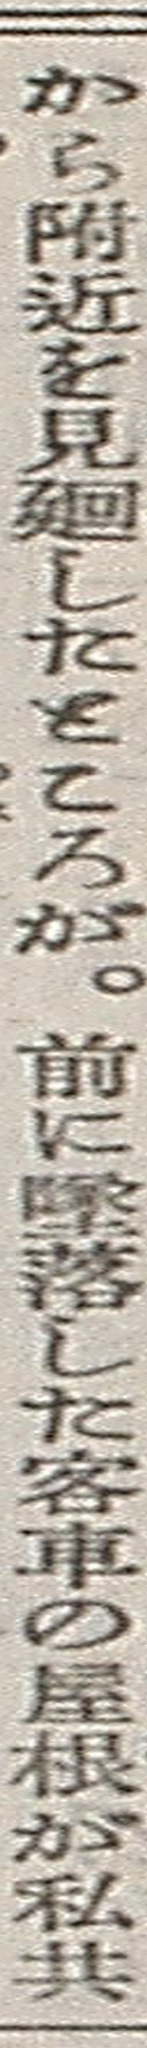から附近を見廻したところが。前に墜落した客車の屋根が私共
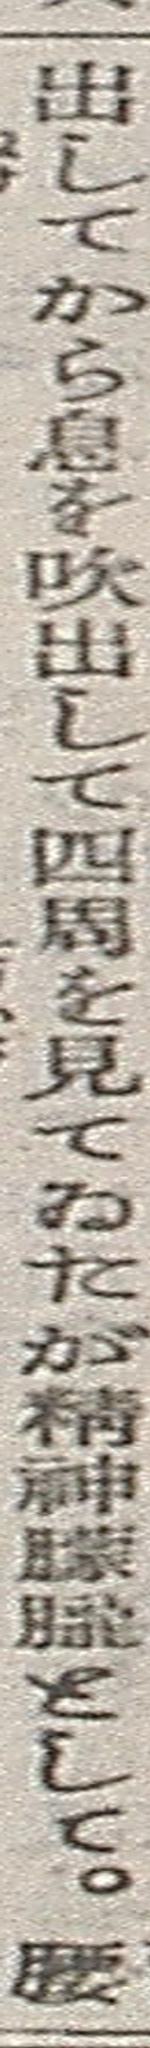出してから息を吹出して四周を見てゐたが精神朦朧として。腰
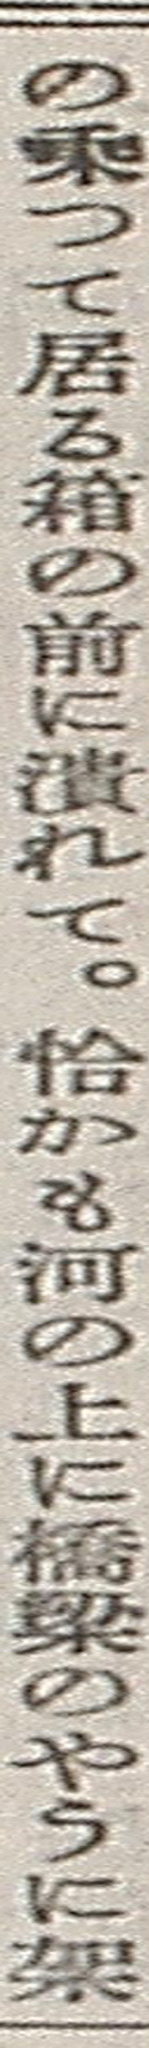の乗つて居る箱の前に潰れて。恰かも河の上に橋梁のやうに架
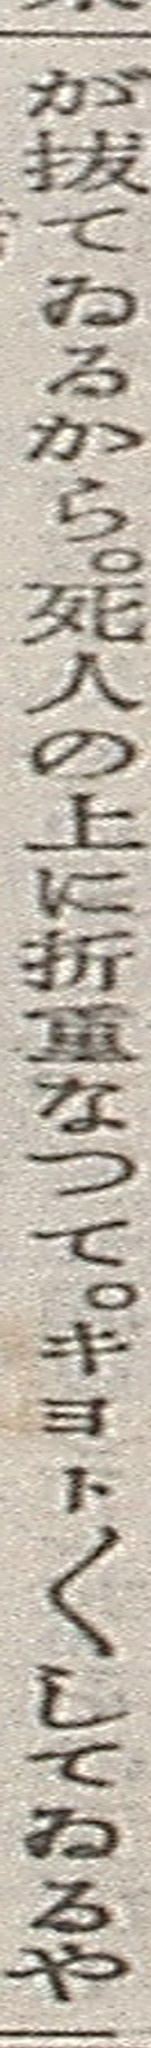が抜てゐるから。死人の上に折重なつて。キヨト〳〵してゐるや
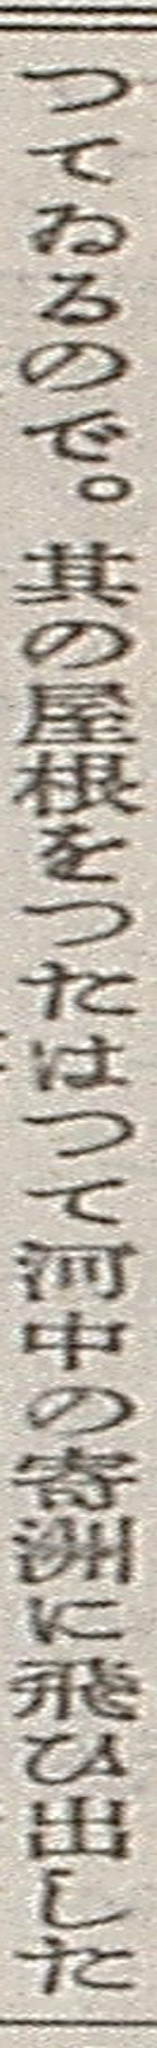つてゐるので。其の屋根をつたはつて河中の寄洲に飛ひ出した
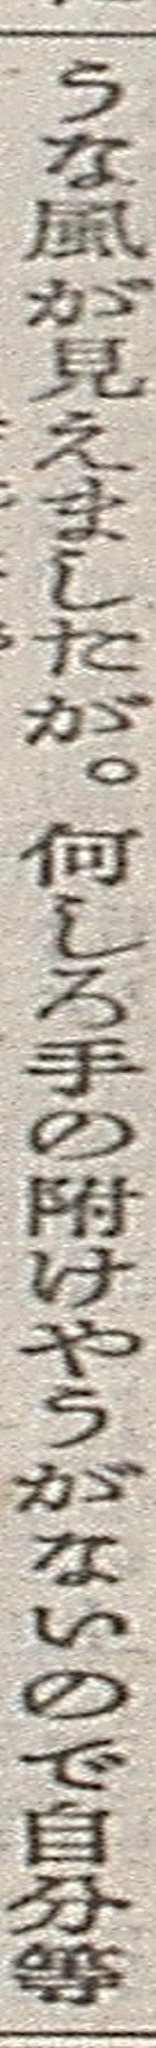うな風が見えましたが。何しろ手の附けやうがないので自分等
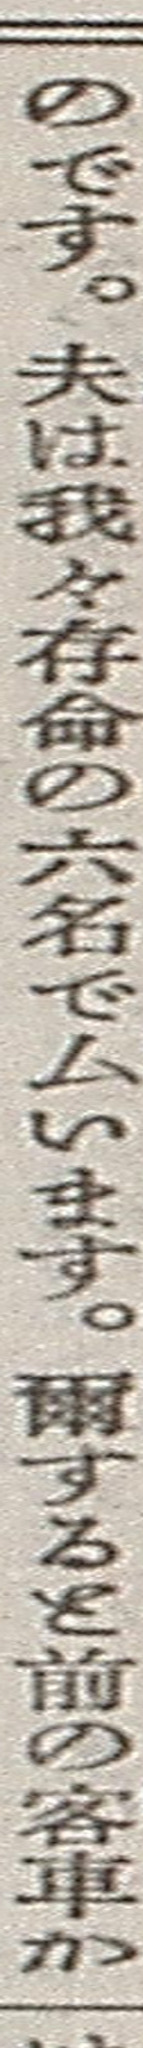のです。夫は我々存命の六名で厶います。爾すると前の客車か
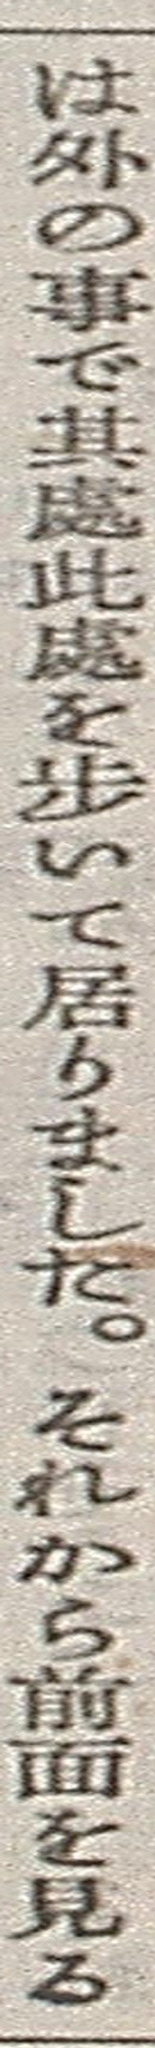は外の事で其処此処を歩いて居りました。それから前面を見る
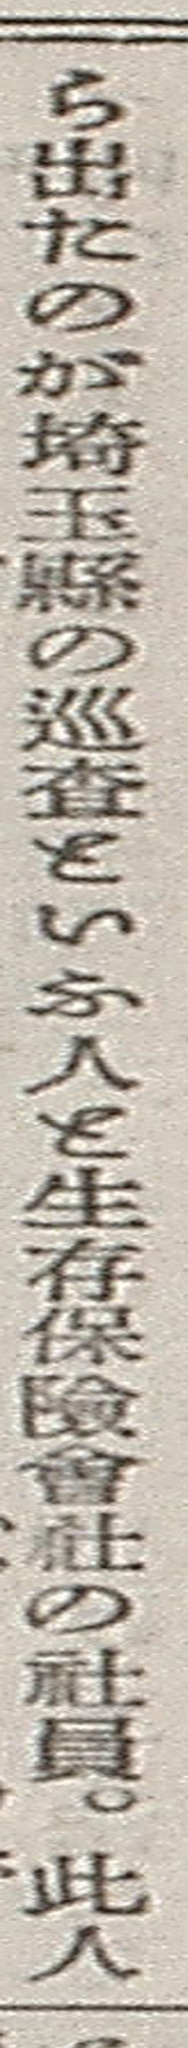ら出たのが埼玉県の巡査といふ人と生存保険会社の社員。此人
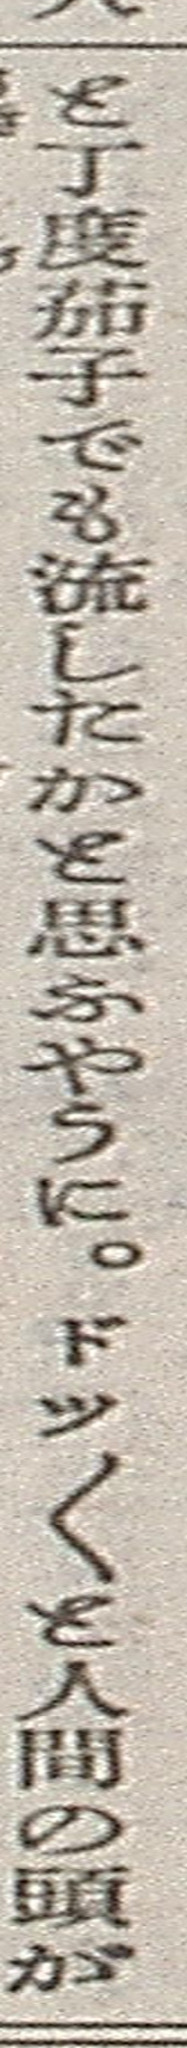と丁度茄子でも流したかと思ふやうに。ドツ〳〵と人間の頭が
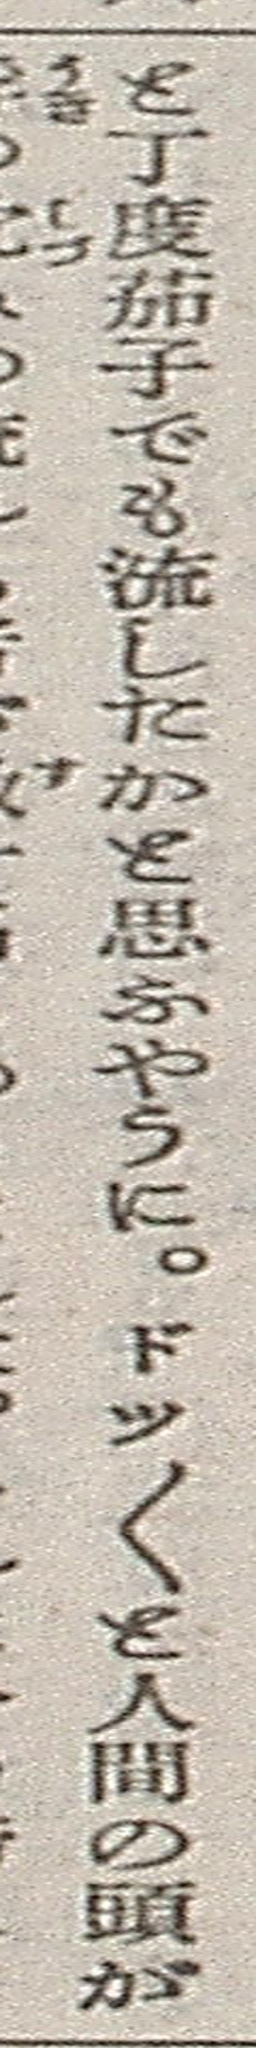と丁度茄子でも流したかと思ふやうに。ドツ〳〵と人間の頭が
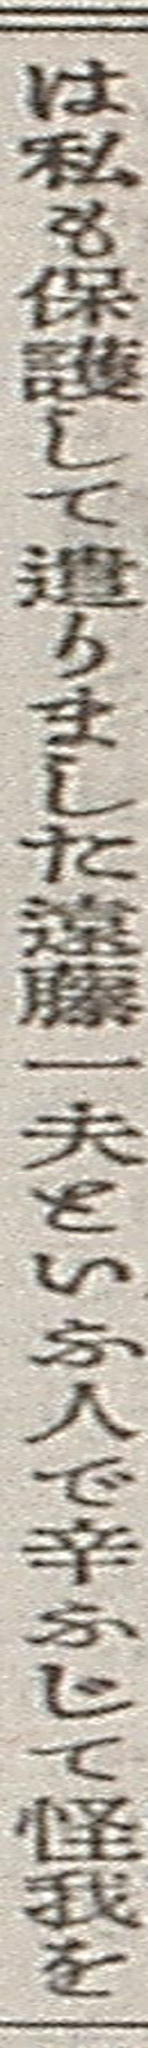は私も保護して遣りました遠藤一夫といふ人で辛ふじて怪我を
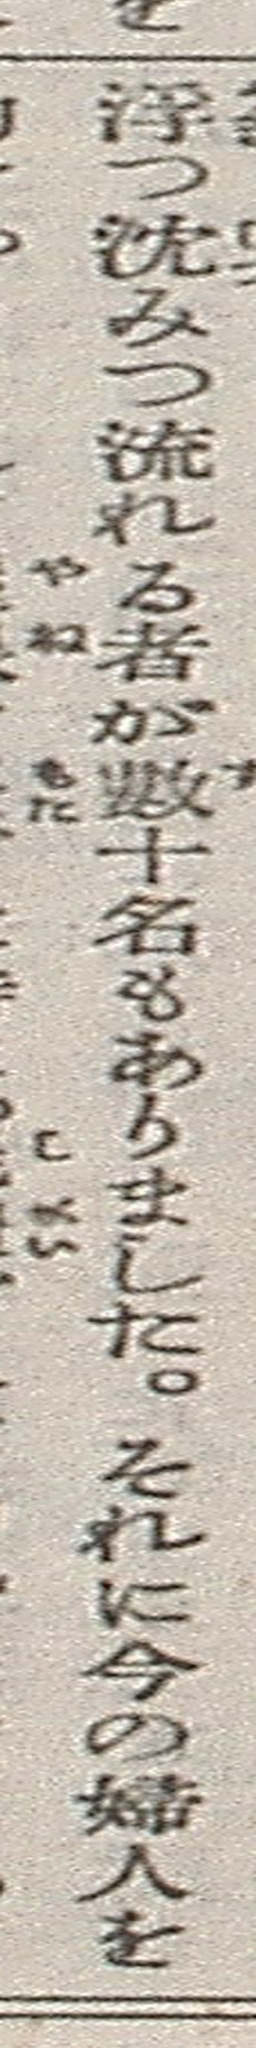浮つ沈みつ流れる者が数十名もありました。それに今の婦人を
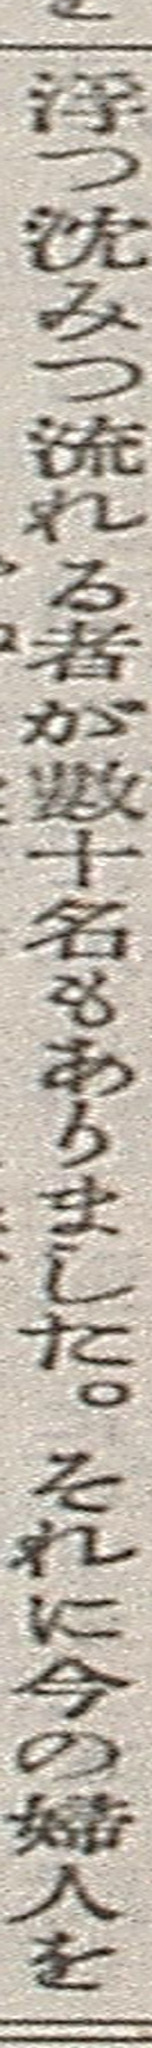浮つ沈みつ流れる者が数十名もありました。それに今の婦人を
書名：風俗畫報臨時増刊第百九十九號　明治三十二年十月各地災害圖會（前編之續）
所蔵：東京大学地震研究所図書室 Earthquake Research Institute Library, The University of Tokyo, JAPAN
